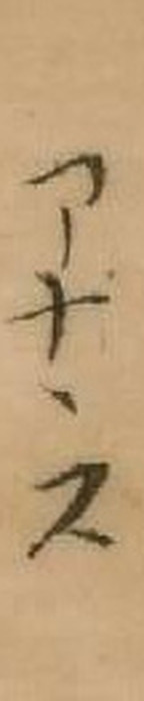アナヽス

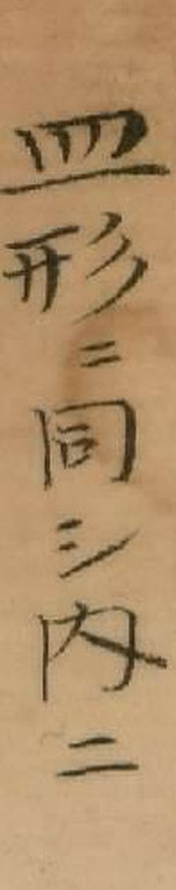皿形ニ同シ内ニ
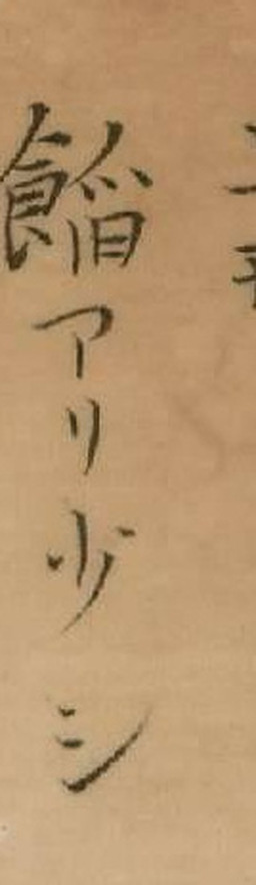餡アリ少シ
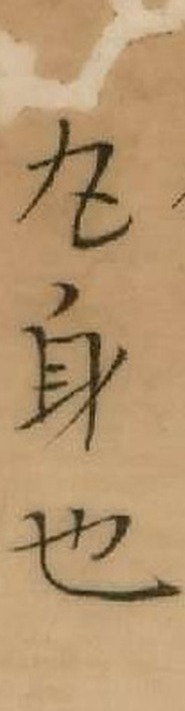丸身也
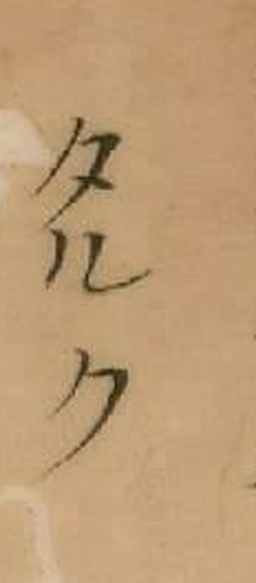タルク
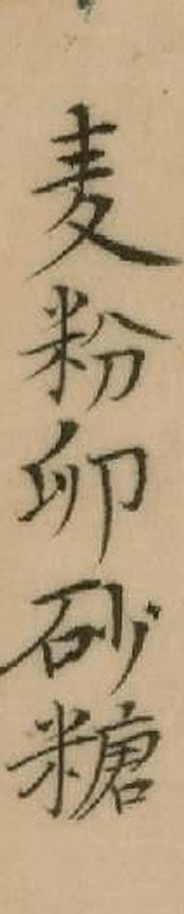麦粉卵砂糖
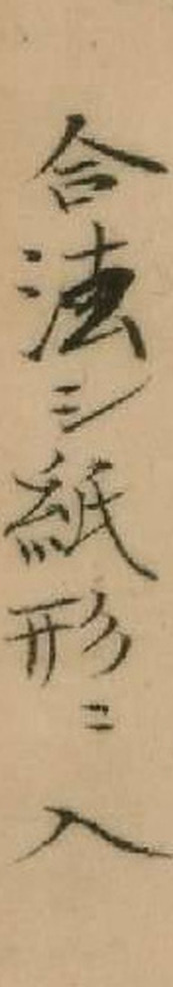合法シ紙形ニ入
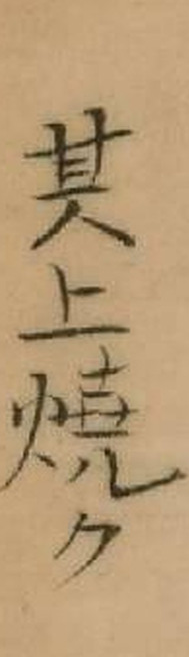其上焼ク
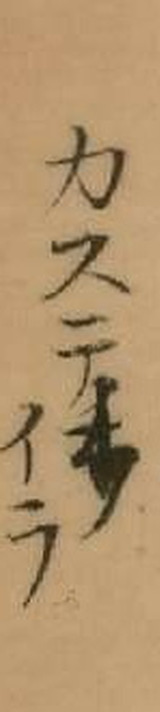カステイラ
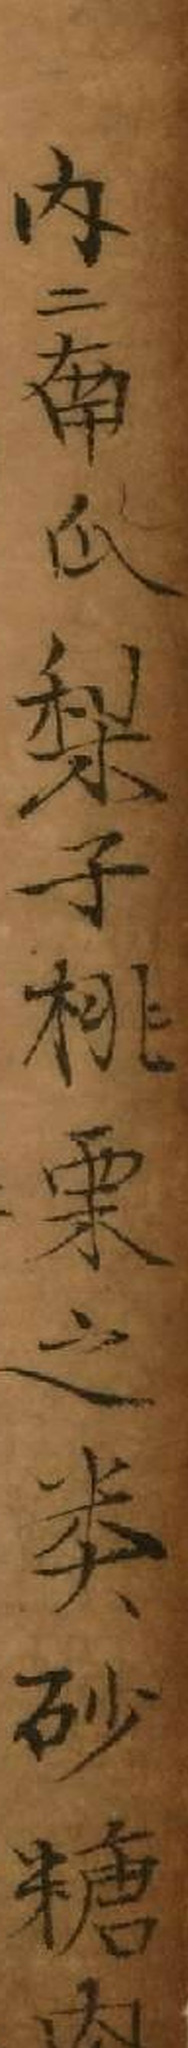内ニ南瓜梨子桃栗之類砂糖肉
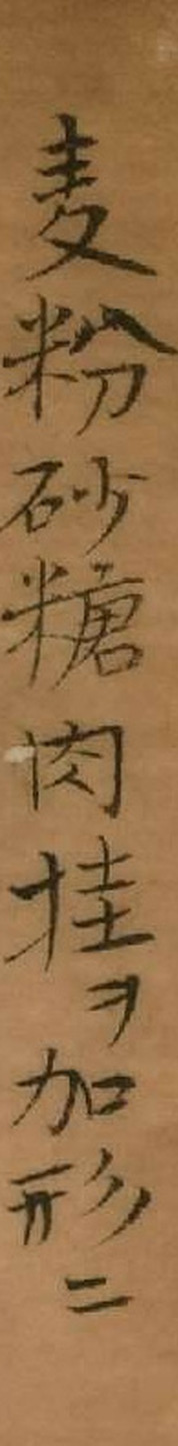麦粉砂糖肉桂ヲ加形ニ
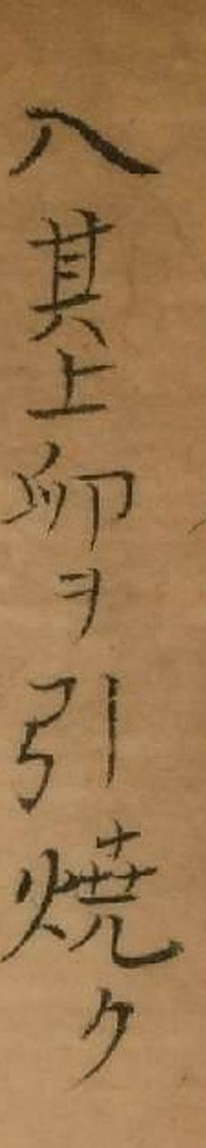入其上卵ヲ引焼ク
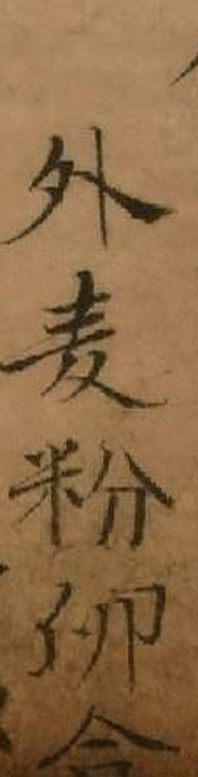外麦粉卵合
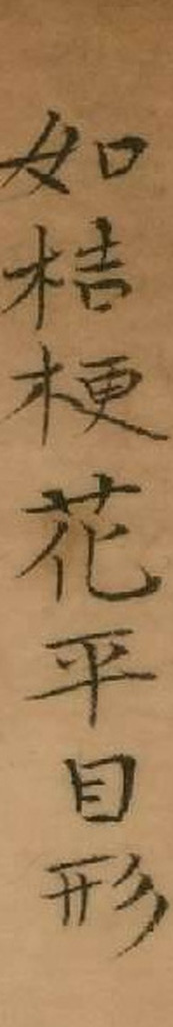如桔梗花平目形
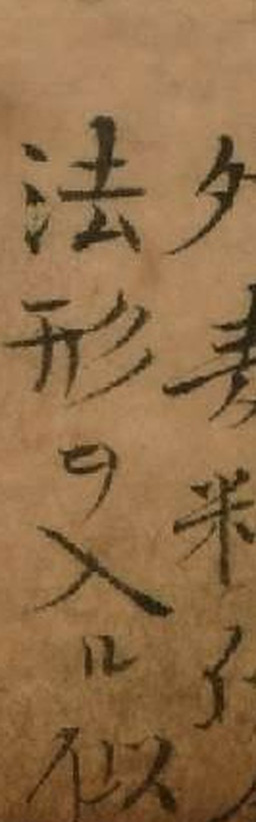法形ヲ入ル似
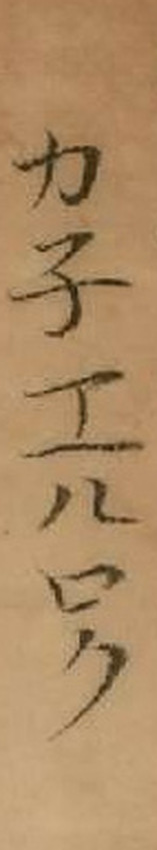カネエルロク
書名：和蘭規式料理絵図
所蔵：神戸大学附属図書館 国文学研究資料館
